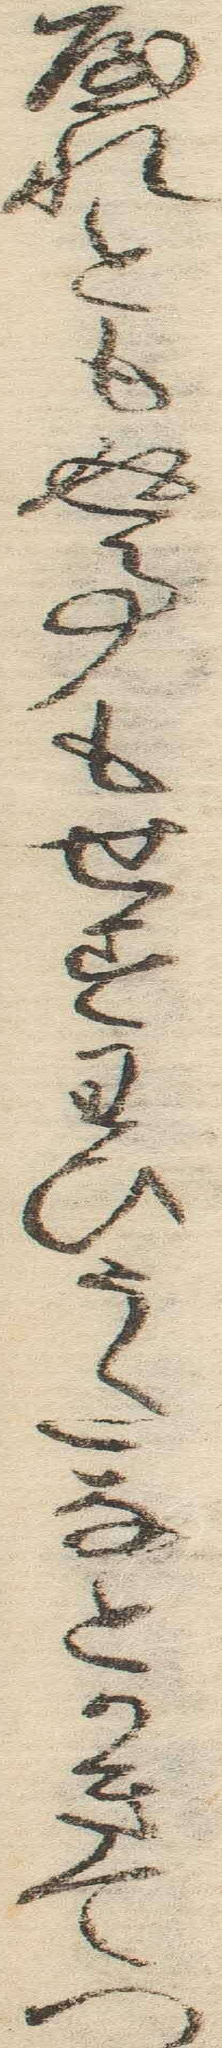やれとも返事もせすわひうたなとかきてつ

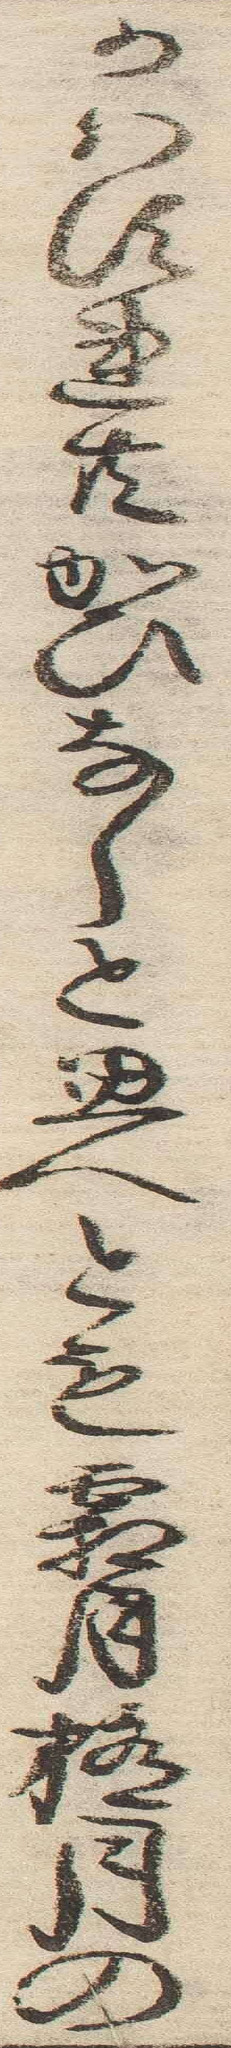かはすれ共かひなしと思へとも霜月極月の
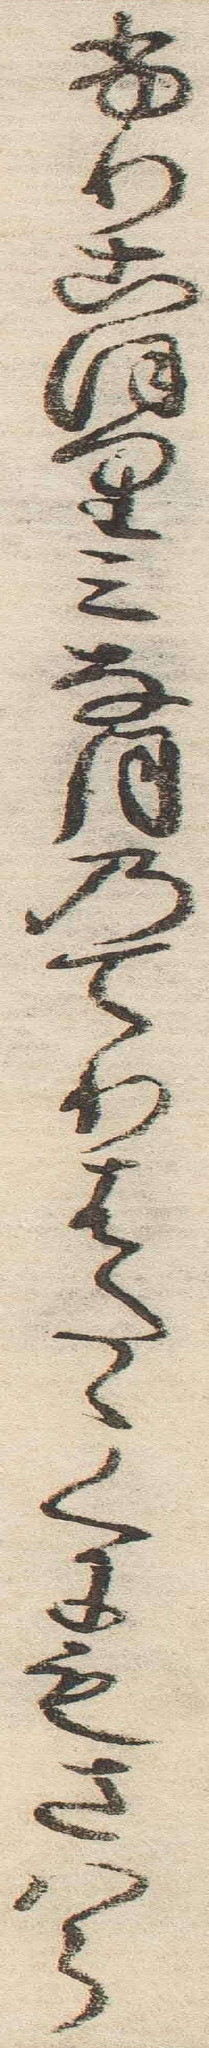ふりこほりみな月のてりはたゝくにもさはら
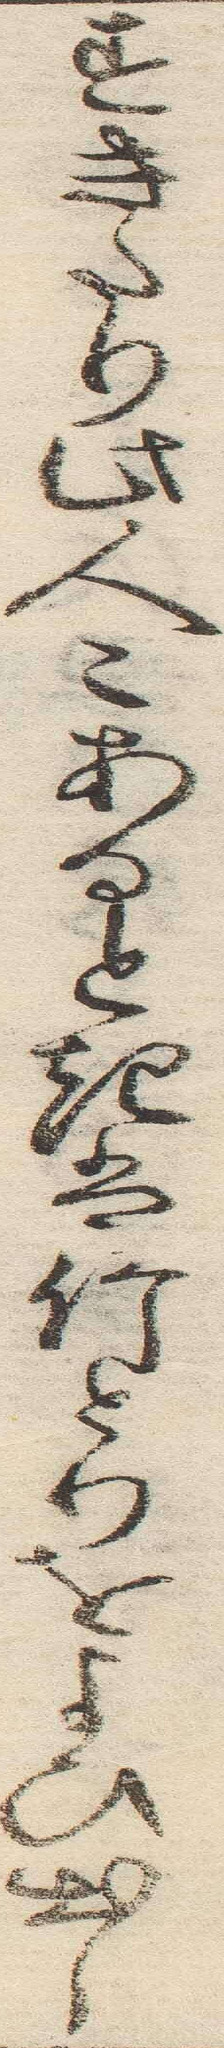すきたり此人々あるときは竹とりをよひ出し
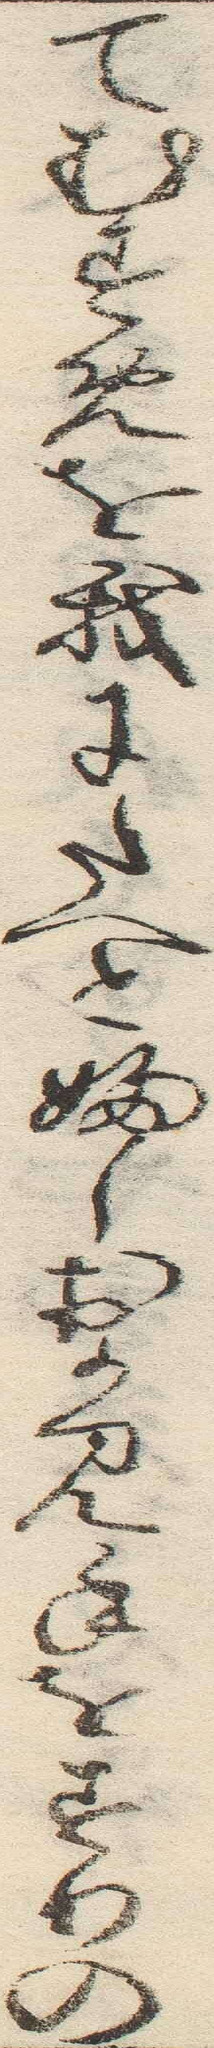てむすめを我にたへとふしおかみ手をすりの
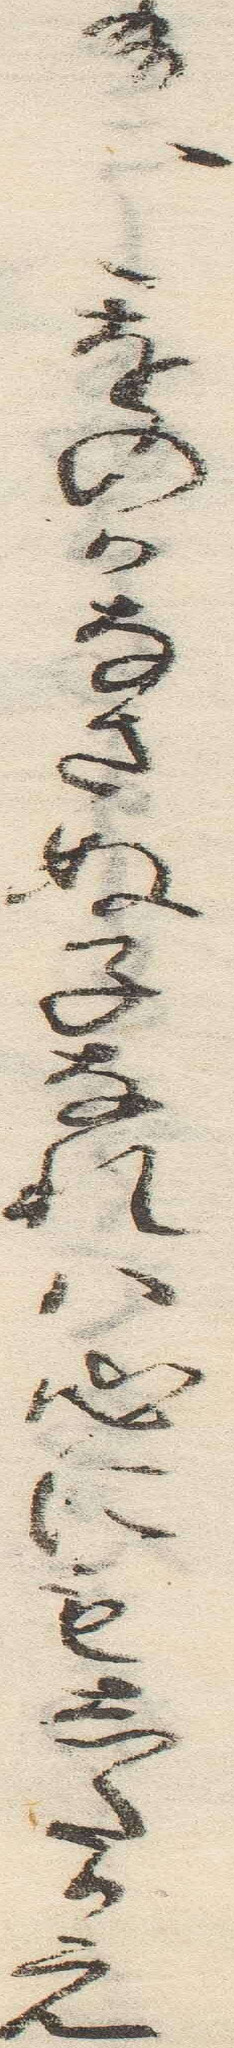給へをのかなさぬ子なれは心にもしたかえ
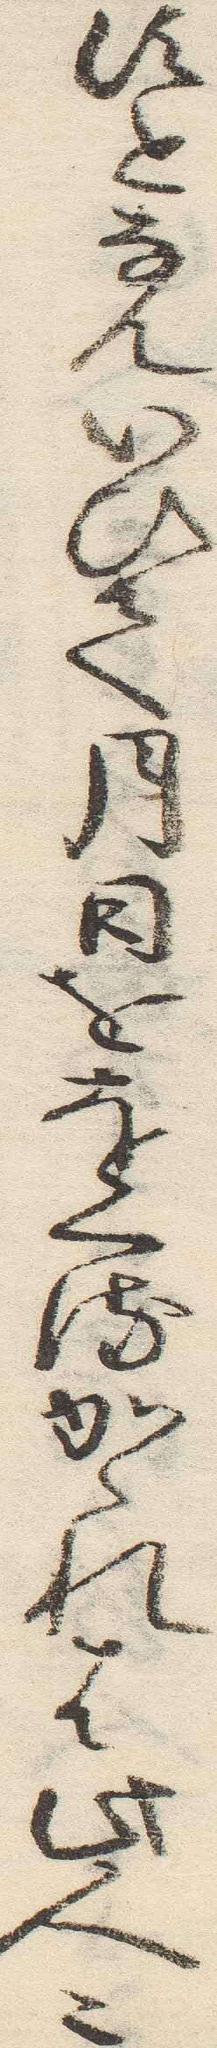すとなんいはく月日ををくるかゝれは此人々
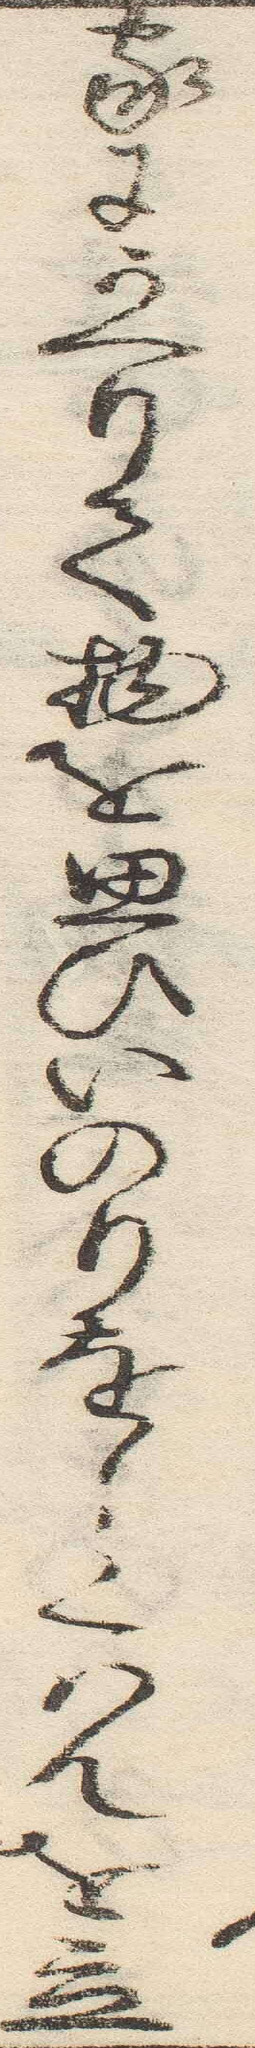家にかへて物を思ひいのりをしくはんを立
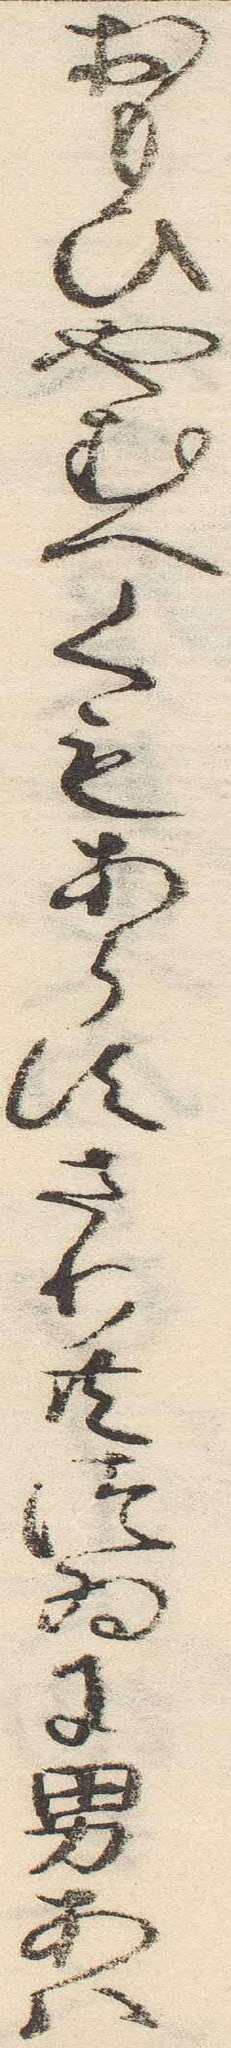おもひやむへくもあらすさり共つゐに男あは
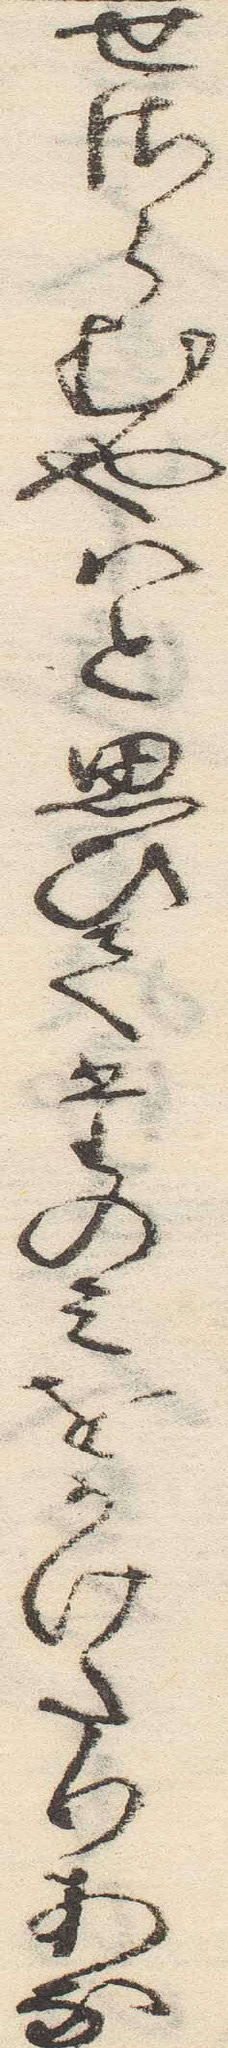せさらむやはと思ひてたのみをかけたりあな
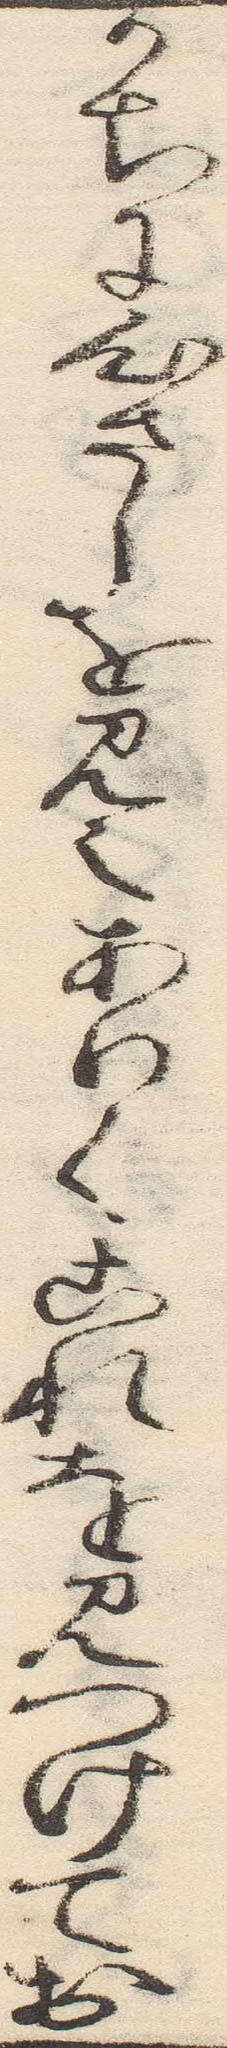かちに心さしを見えありくこれを見つけてお
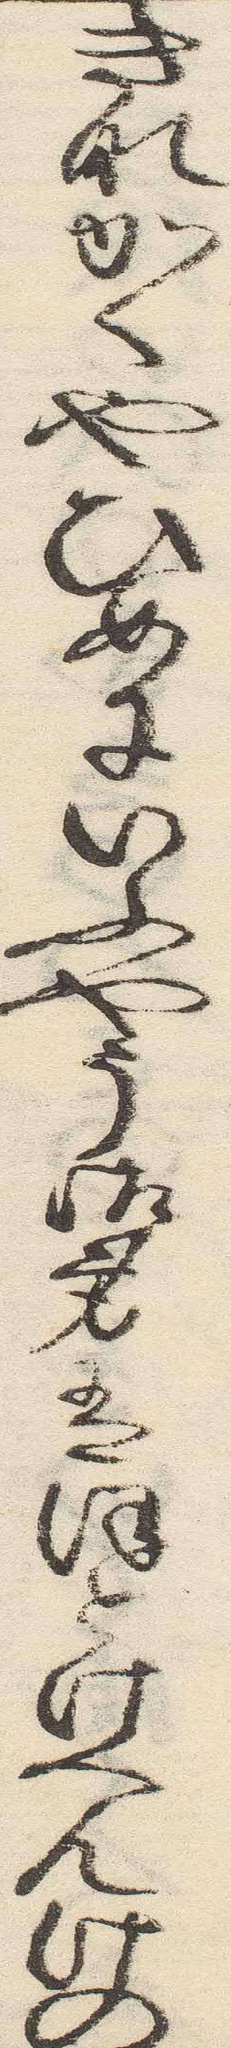きなかくやひめにいふやう御身はほとけへんけの
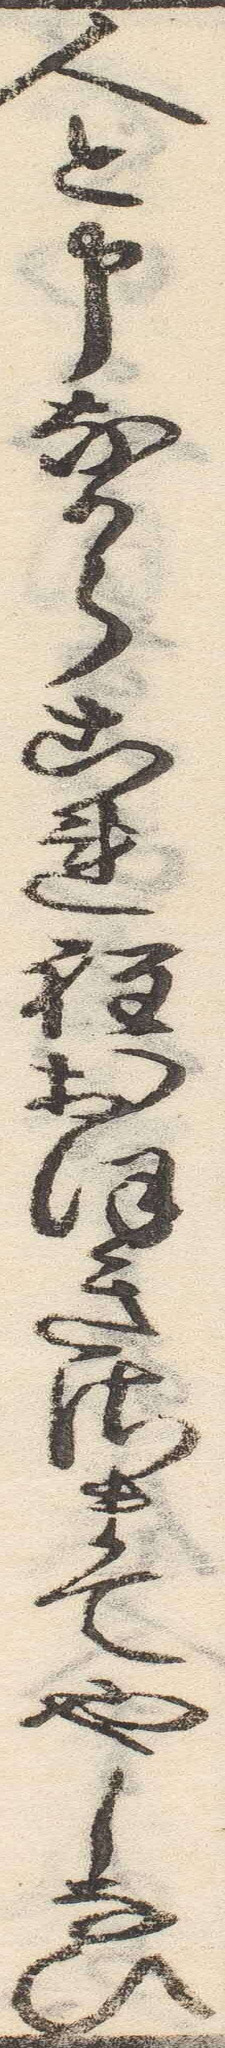人と申なからこれ程おほきさまてやしなひ
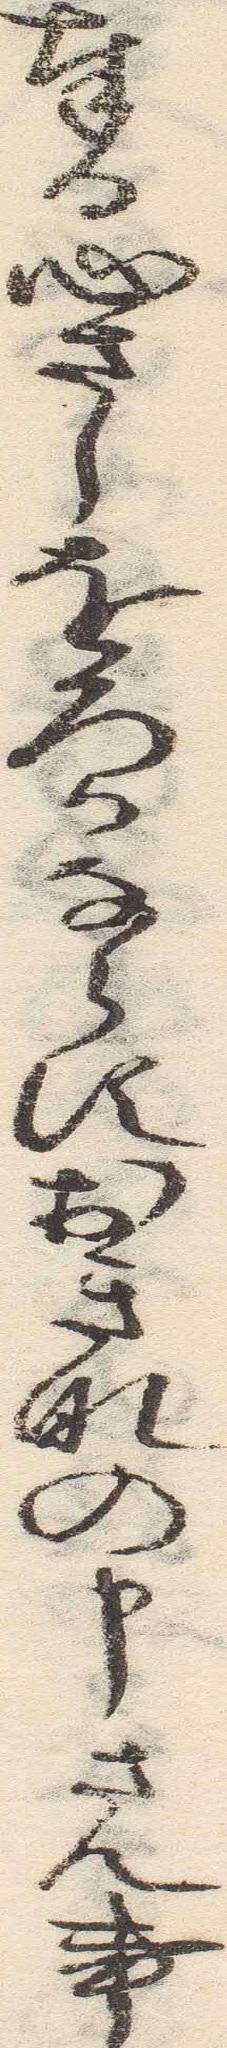奉る心さしをろかならすおきなの申さん事
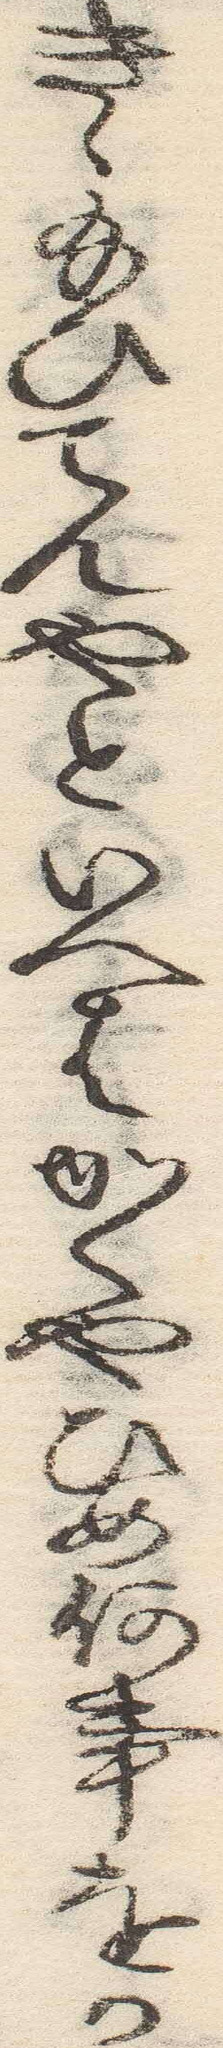きゝ給ひてんやといへはかくやひめ何事をか
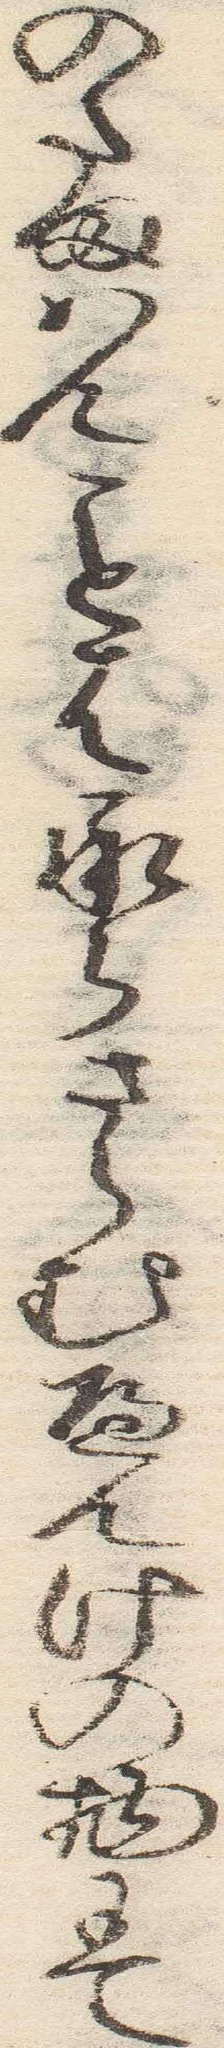のたまはんことは承らさらむへんけの物にて
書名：竹取物語
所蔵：東京学芸大学附属図書館 国文学研究資料館
